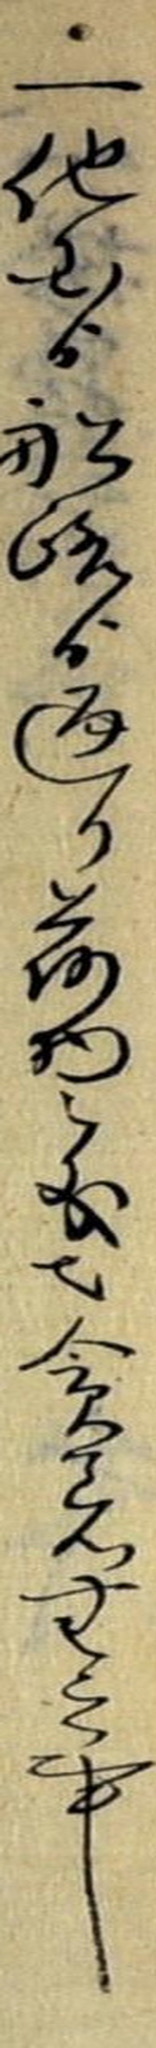一他国ゟ船路ゟ通り荷物之儀者貪着無之事
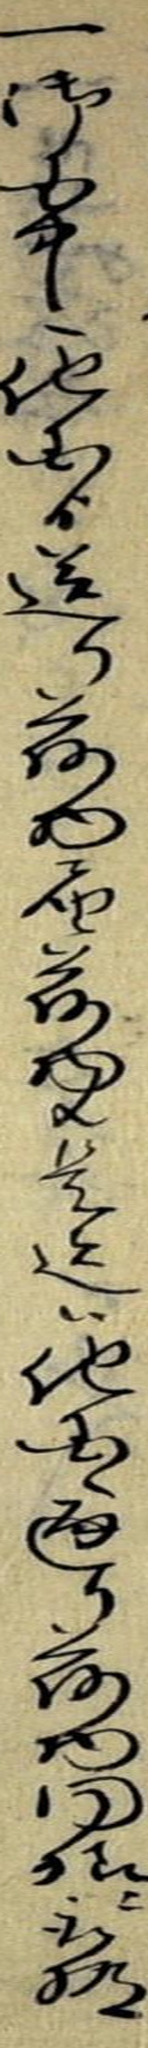一御国中へ他国ゟ送り荷物届荷物共是迄ハ他国へ通り荷物同様被取扱
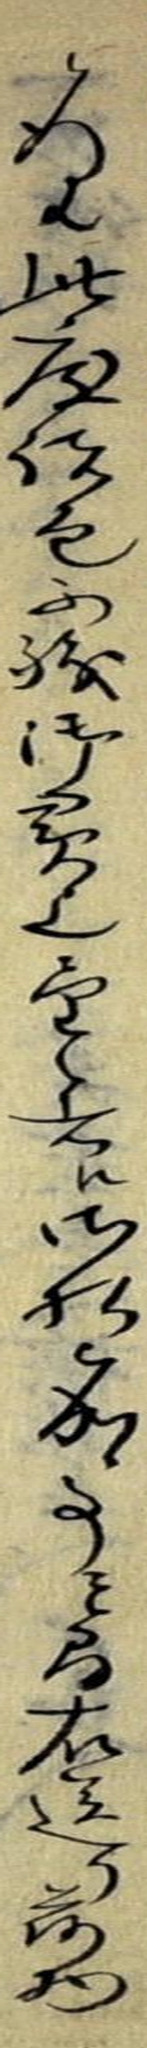候得共此度諸色不残御買上望之者江御払被成候事ニ候間右送り荷物
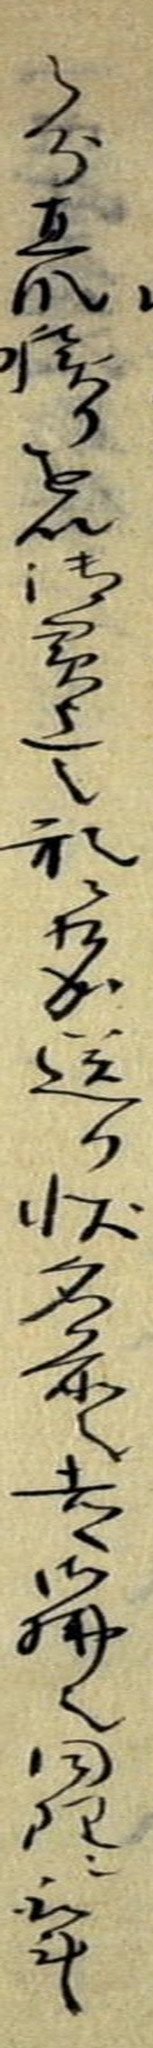之分直段積りを以御買上之形ニ相成送り状名前之者へ御払之日限被取計
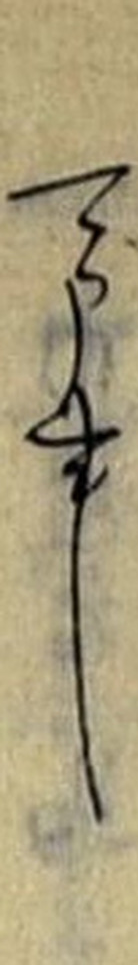可申事
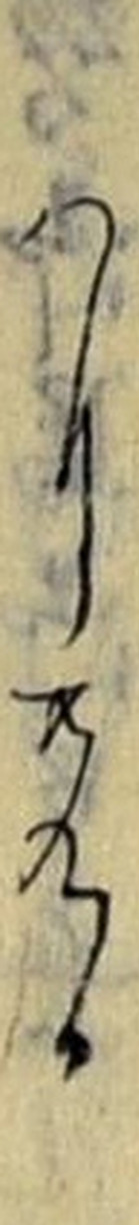八月廿九日
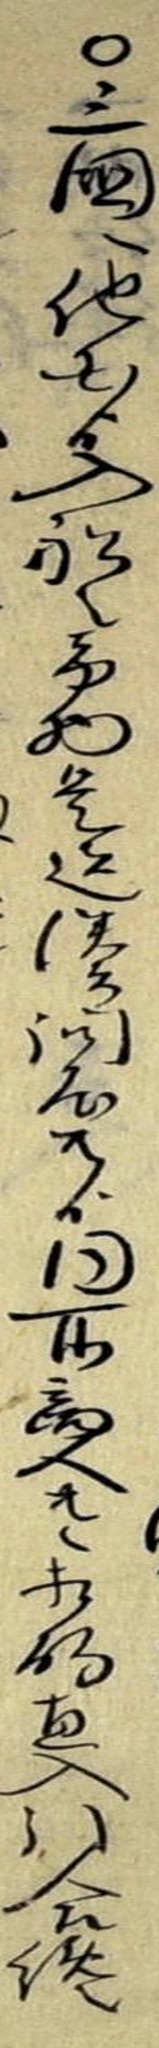○三国へ他国ゟ入船之商物是迄湊問屋共ゟ同所商人共へ相触直入引合纔
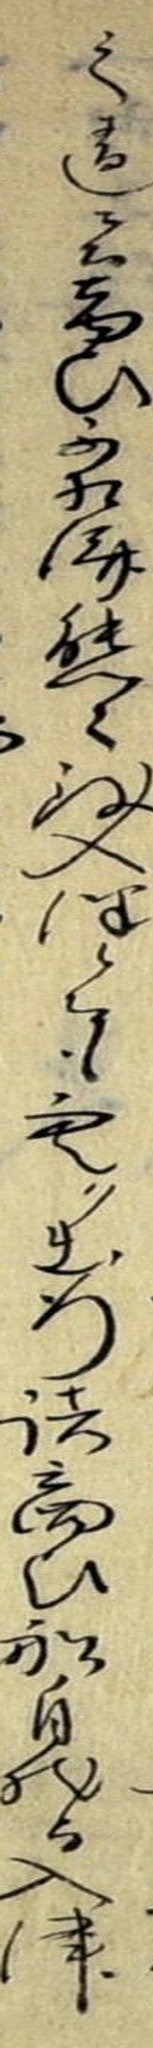之違ニ而商ひ不相済態々致入津候而も空ク出行諸商ひ船自然与入津
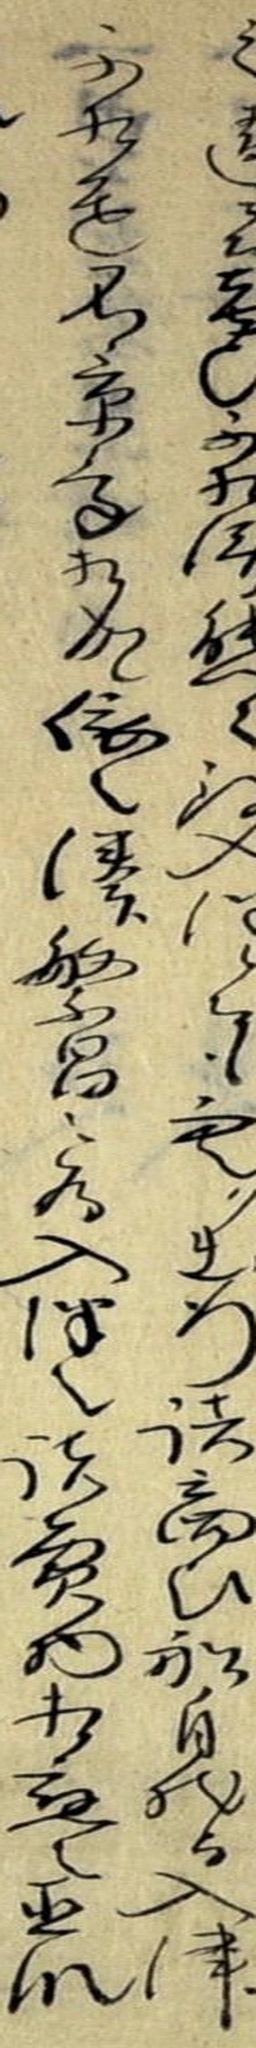不相遣不景気相成候依之湊繁昌之為入津之諸買物相応之直段
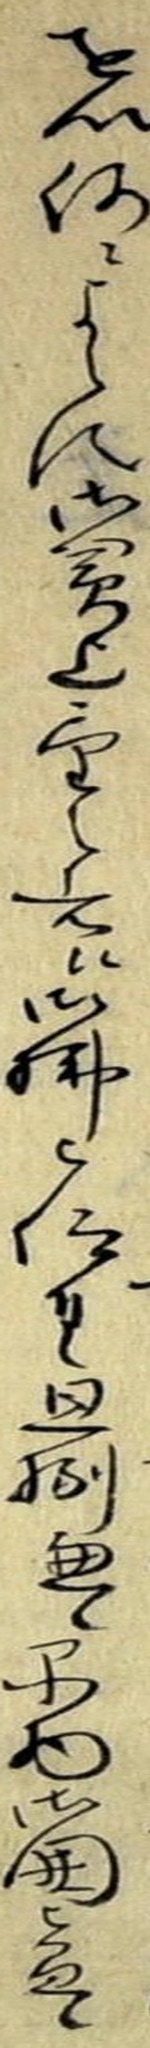を以何ニよらす御買上望之者江御払被仰付候且捌兼候品物御囲被置候
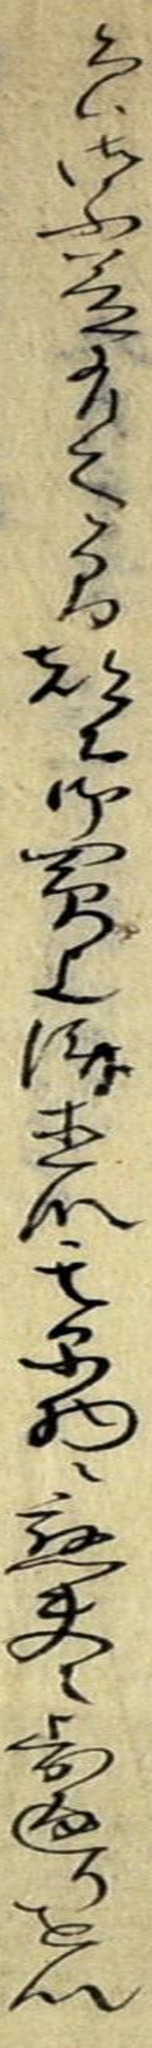而ハ御不益有之候間都而御買上済直段其品物ニ応夫之歩通りを以
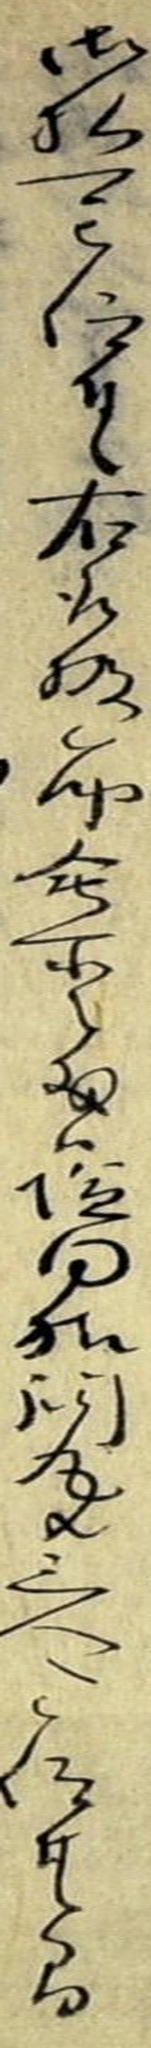御払可被仰付候右取扱筋会所之義ハ塩同様問丸共三人へ被仰付候間
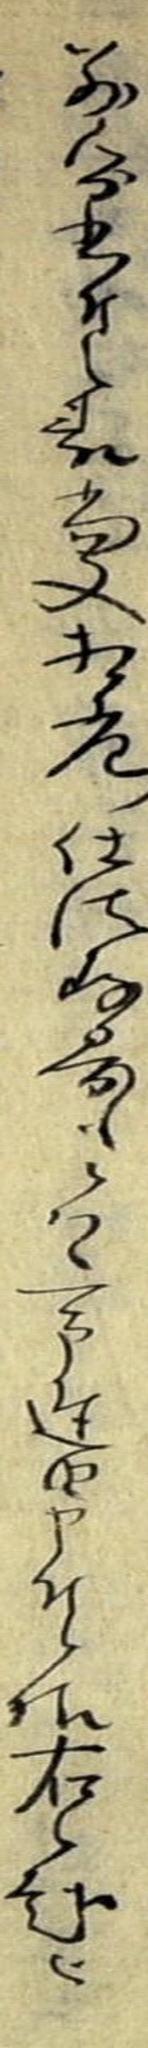別紙書付之表尚又相考仕法存寄も候ハヽ可申達由申付候様右之趣被
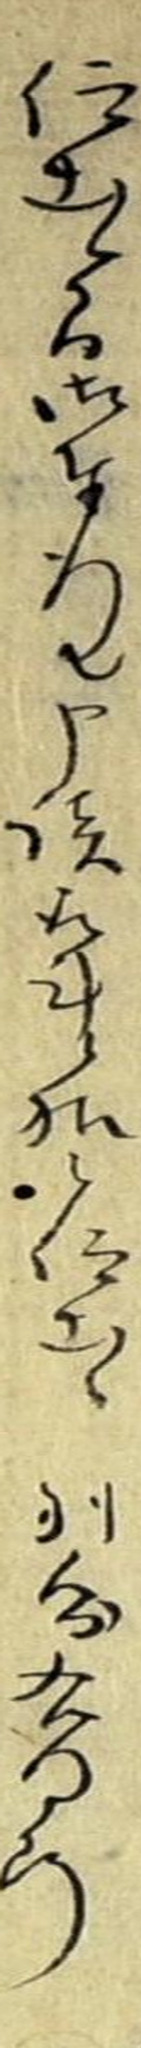仰出候間御奉行共申談取計候様被仰出候別紙右同断

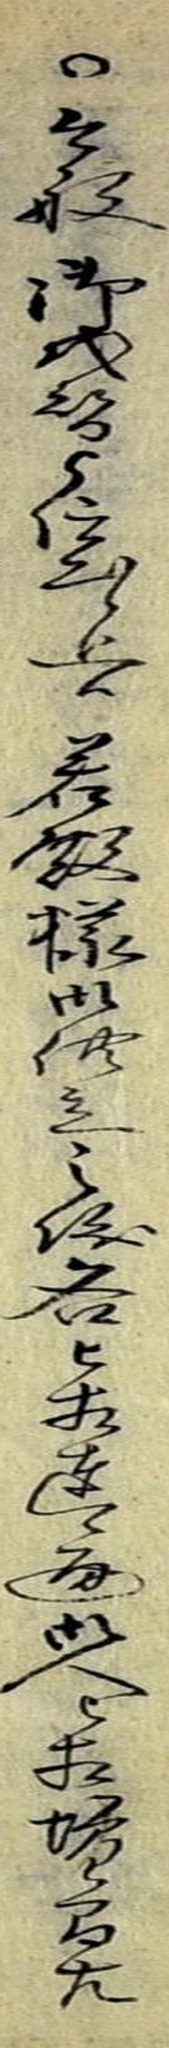○今般御代替被仰出候上ハ若殿様御供立之儀各被相達候通御人被相増候間左
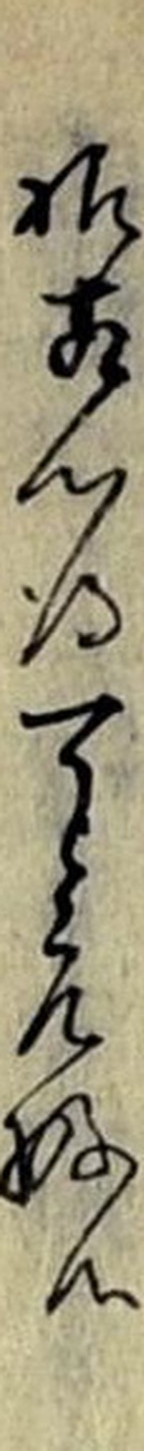様相心得可被取扱候
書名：命令之部 三
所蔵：福井県文書館 Fukui Prefectural Archives
